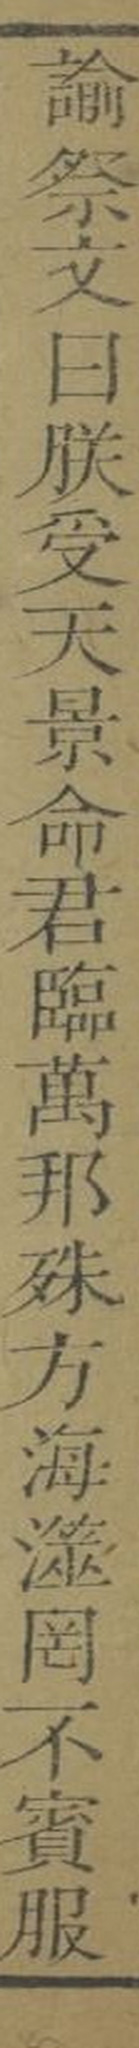諭祭文曰朕受天景命君臨万邦殊方海澨罔不賓服
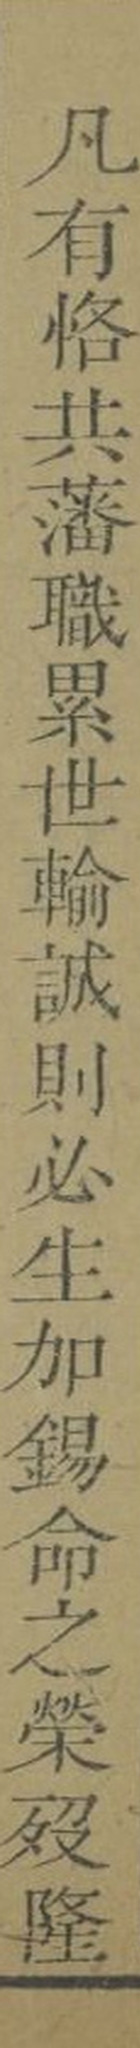凡有恪共藩職累世輸誠則必生加錫命之栄歿隆
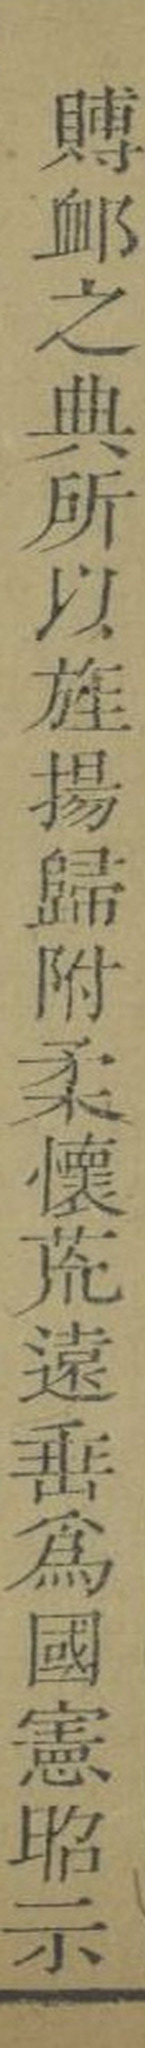賻恤之典所以旌揚帰附柔懐荒遠垂為国憲昭示
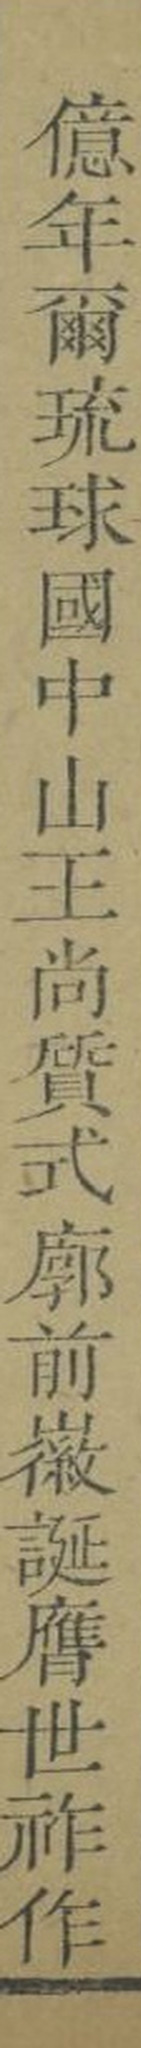億年爾琉球国中山王尚質式廓前徽誕膺世祚作
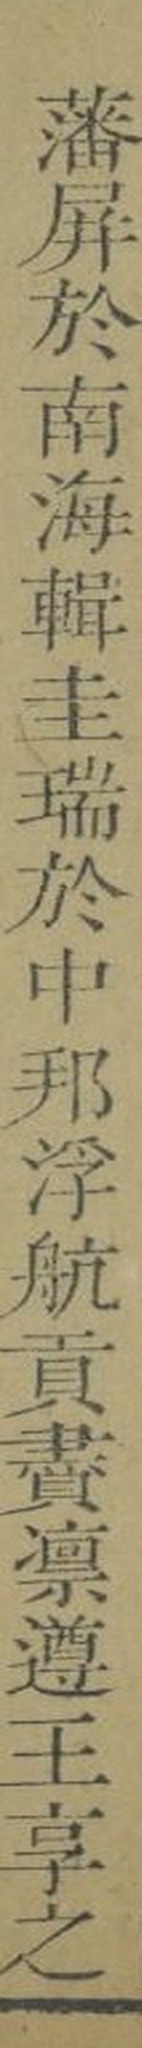藩屏於南海輯圭瑞於中邦浮航貢賮凜遵王享之
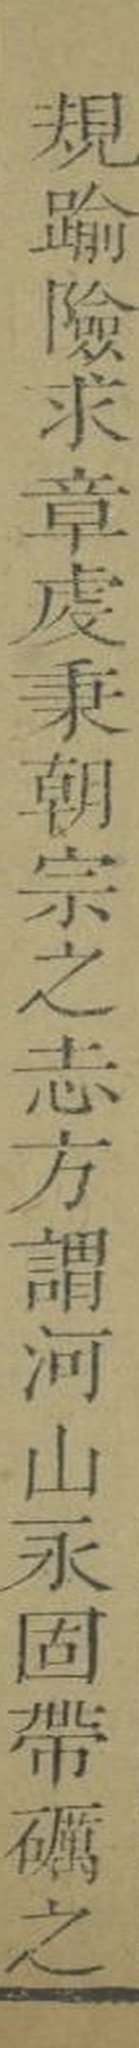規踰険求章虔秉朝宗之志方謂河山永固帯礪之
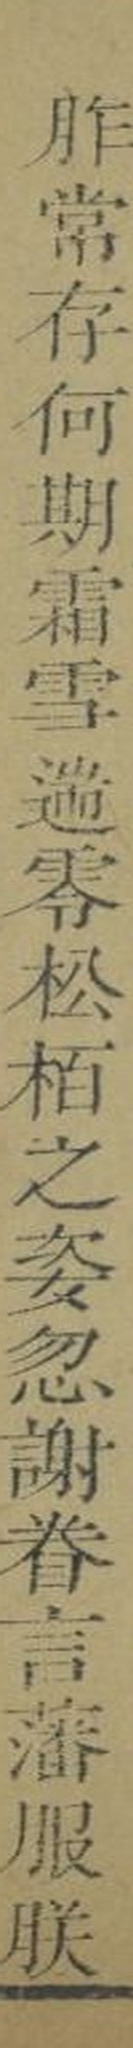胙常存何期霜雪遄零松柏之姿忽謝眷言藩服朕
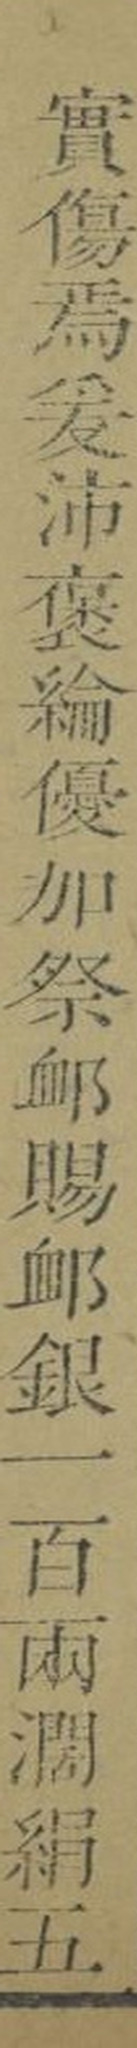実傷焉爰沛褒綸優加祭恤賜恤銀一百両濶絹五
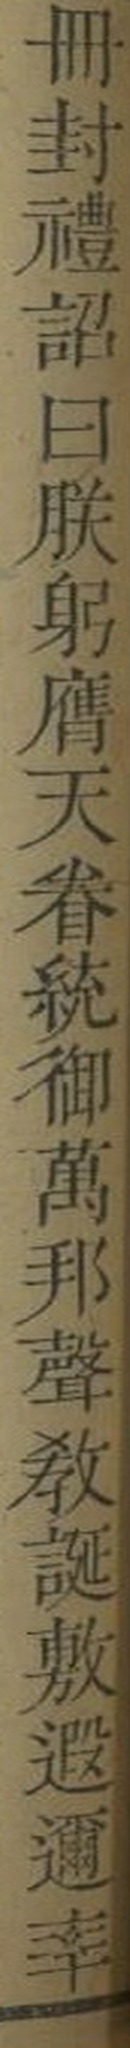冊封礼詔曰朕躬膺天眷統御万邦声教誕敷遐邇率
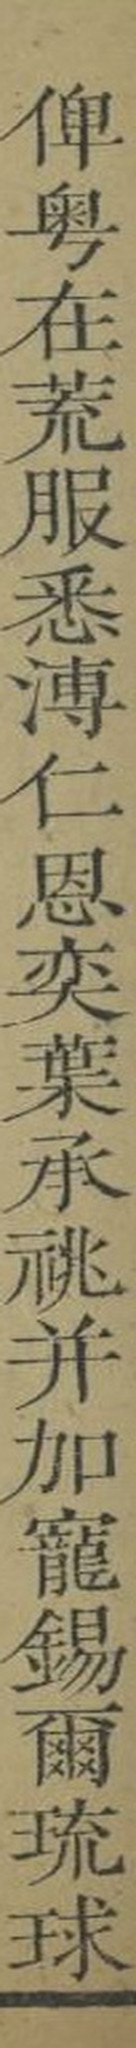俾粤在荒服悉溥仁恩奕葉承祧并加寵錫爾琉球
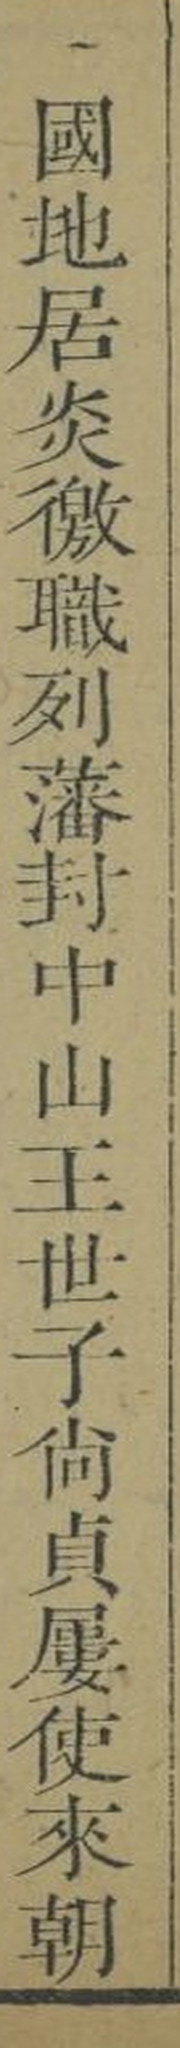国地居炎徼職列藩封中山王世子尚貞屢使来朝
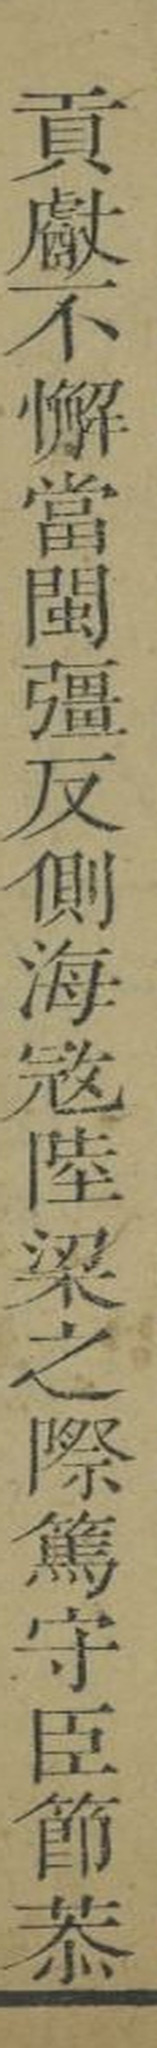貢献不懈当閩彊反側海寇陸梁之際篤守臣節恭
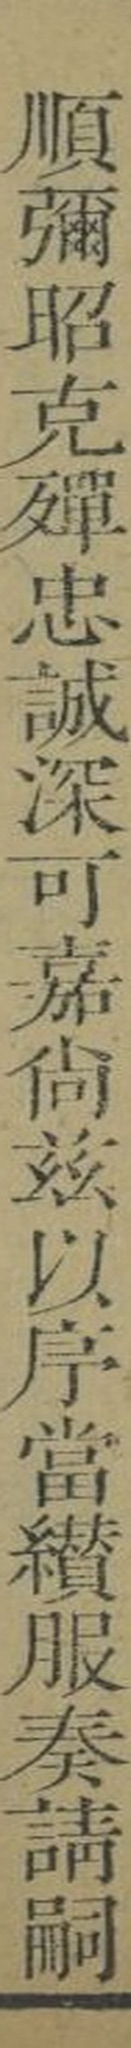順弥昭克殫忠誠深可嘉尚茲以序当纘服奏請嗣
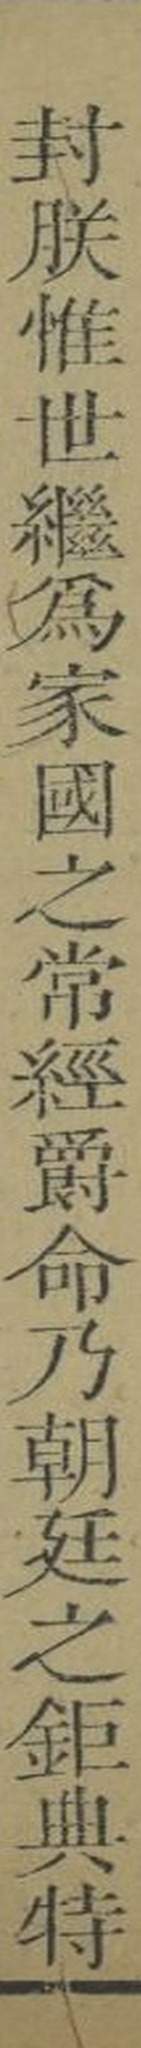封朕惟世継為家国之常経爵命乃朝廷之鉅典特
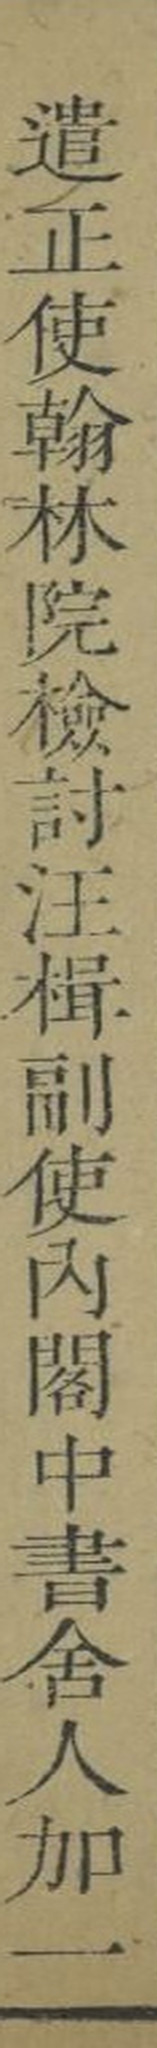遣正使翰林院検討汪楫副使内閣中書舎人加一
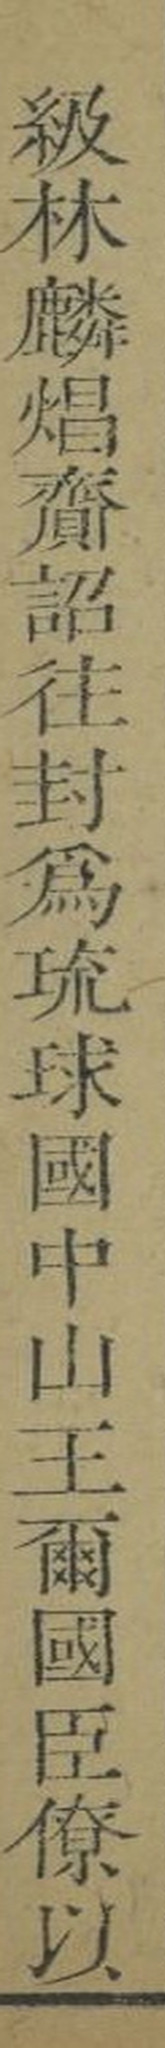級林麟焻齎詔往封為琉球国中山王爾国臣僚以
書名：中山伝信録 巻四
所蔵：University of the Ryukyus Library
